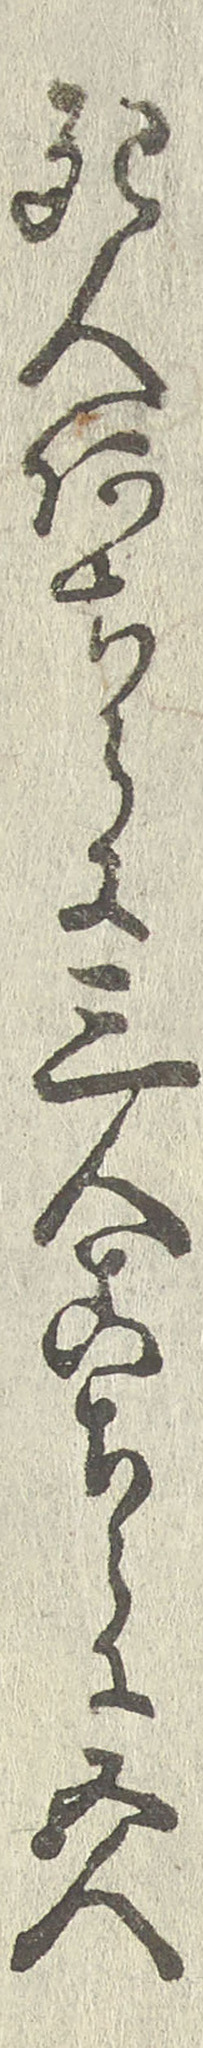死人あちらに三人こちらに五人
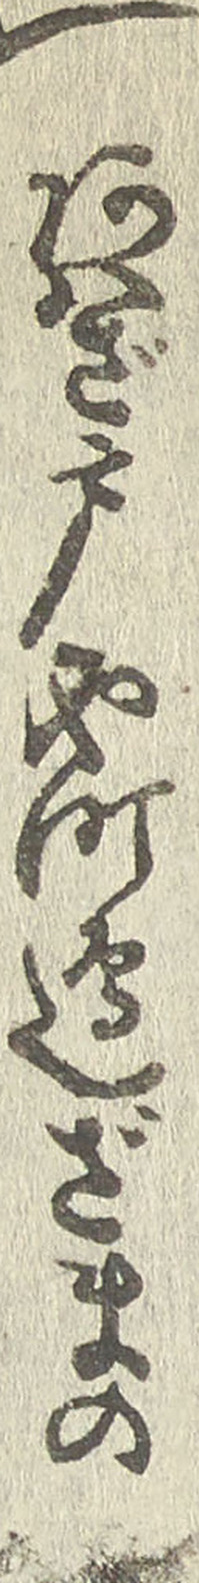あはざ戸や町辺ざまの
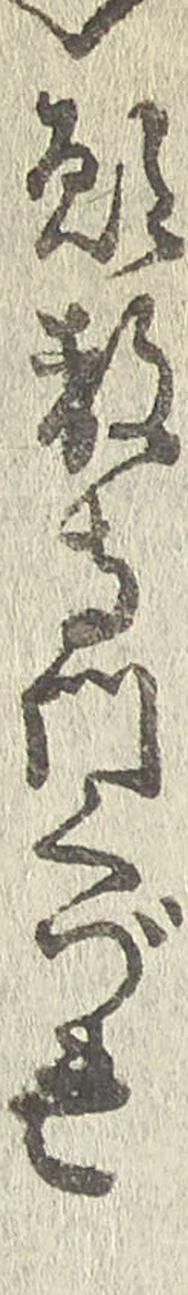願教寺門くづれ
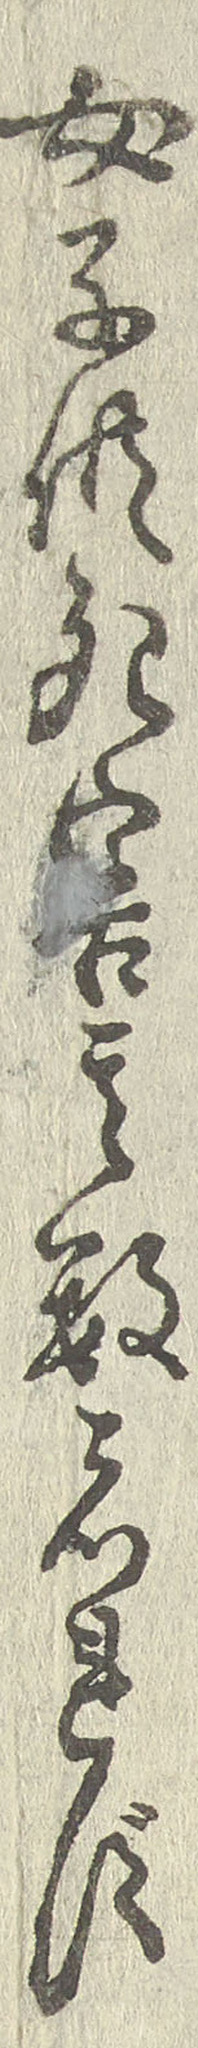女子供死害其数しれず
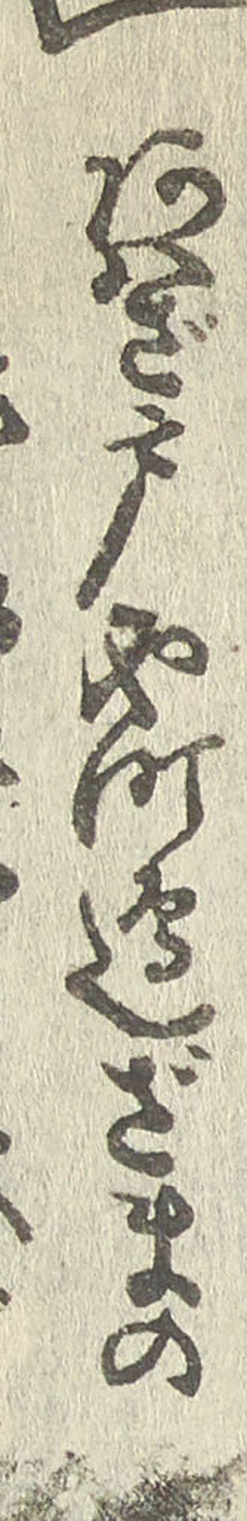あはざ戸や町辺ざまの
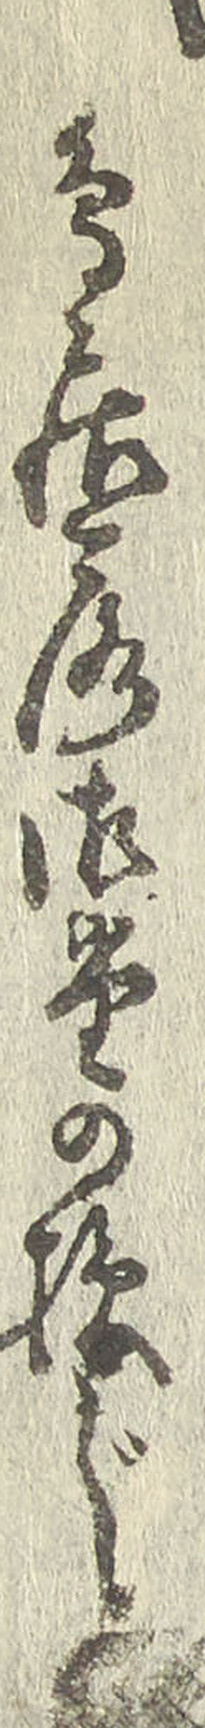鳥居落御堂の損じ
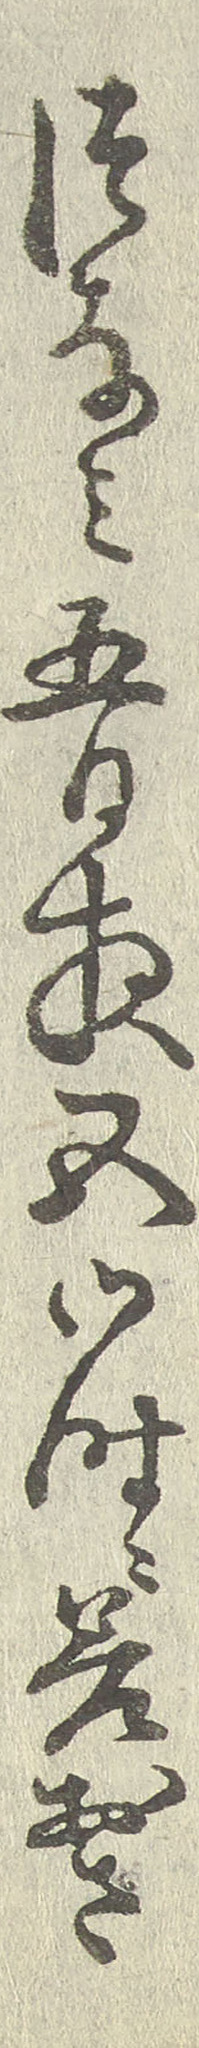つなみ五日夜五ッ時に差おさ
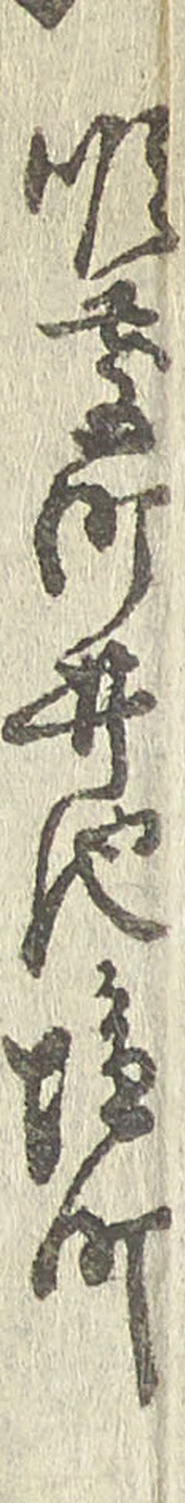順慶町丼池塩町
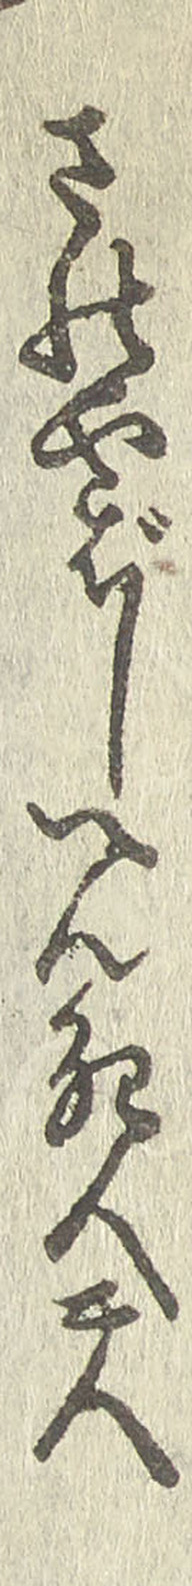さのやばしへん死人二人
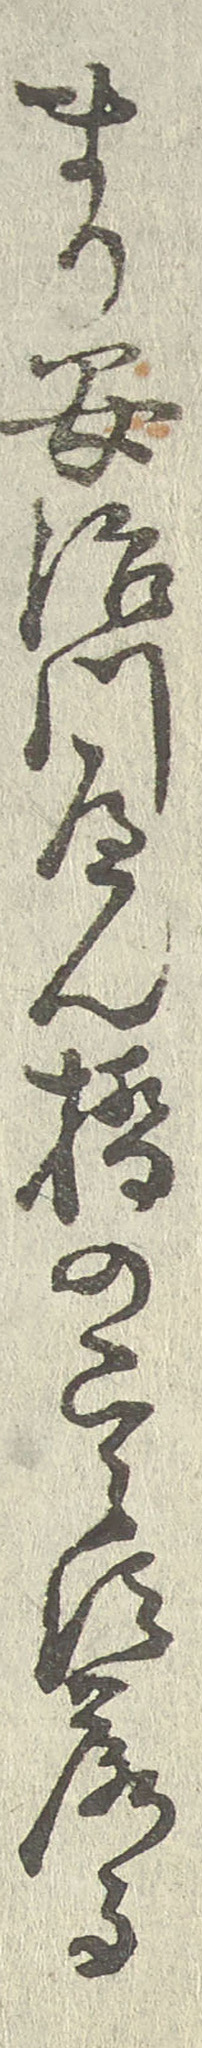まり安治川へん橋のこらす落る
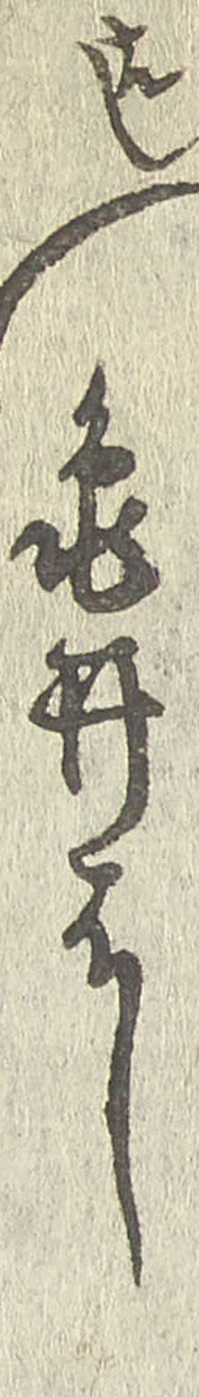亀井はし
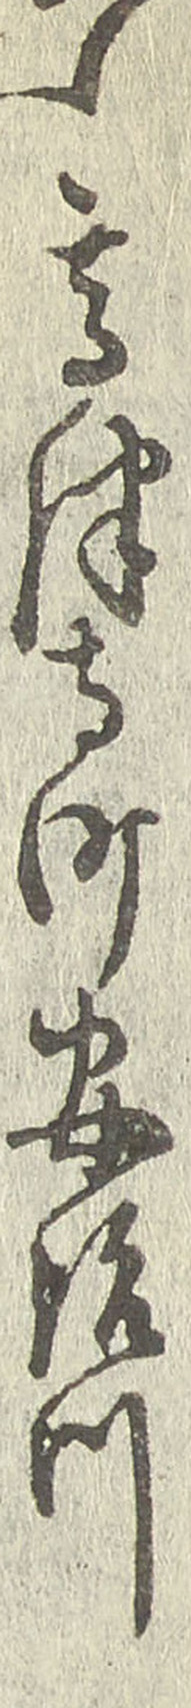高津寺町安治川
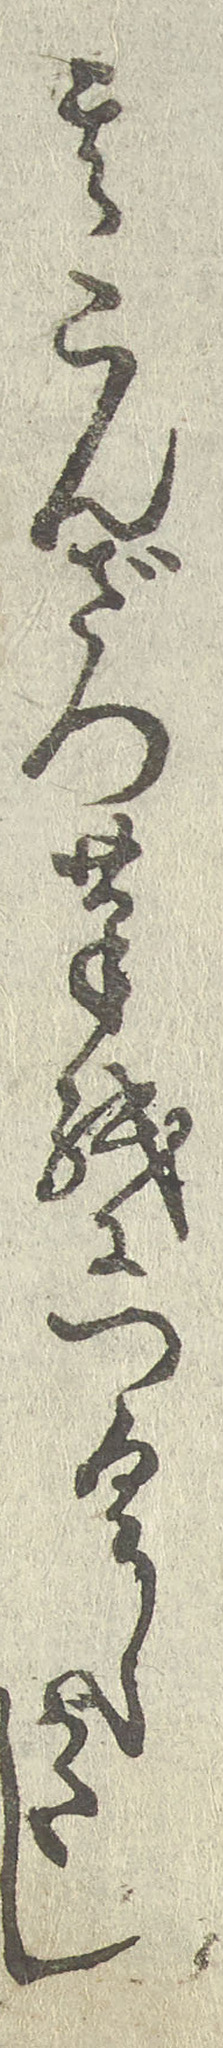其こんざつ筆紙につくしがたし
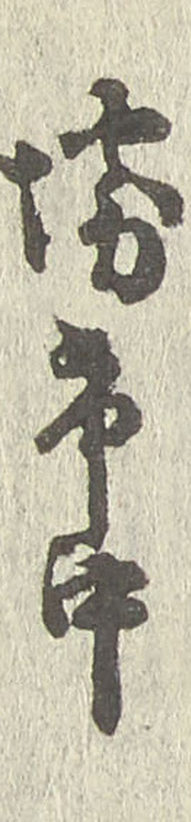堺市中
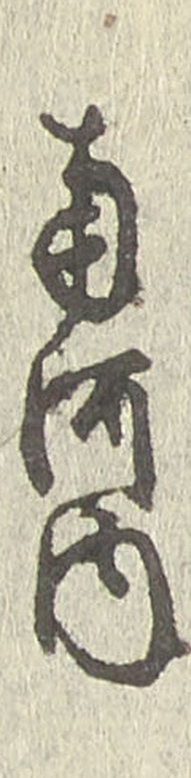南河内
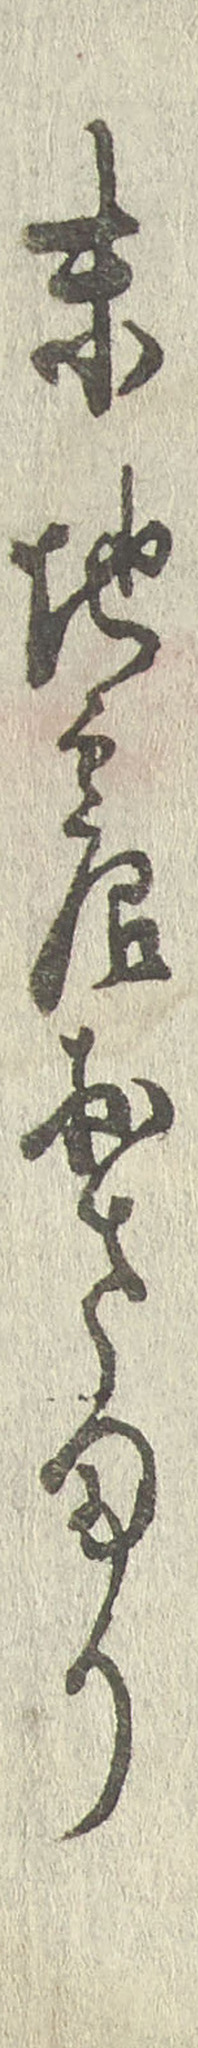未地震おさまり
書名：摂津大津波次第
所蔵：東京大学総合図書館 General Library in the University of Tokyo, JAPAN
